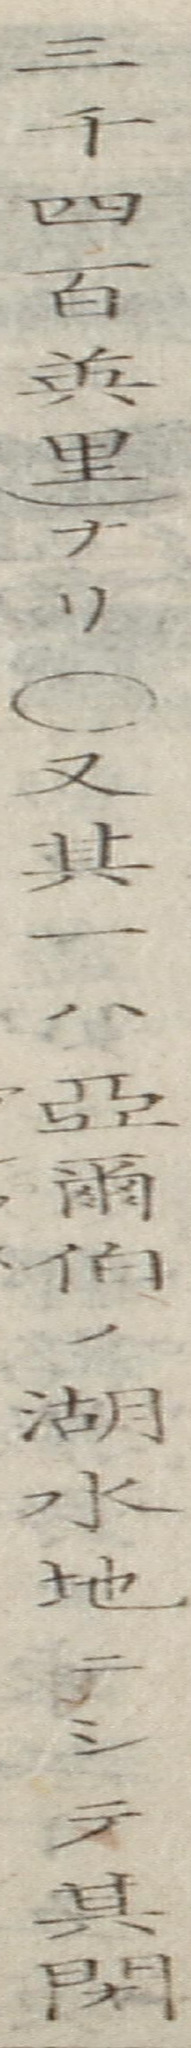三千四百英里）ナリ○又其一ハ亜爾伯ノ湖水地ニシテ其閉
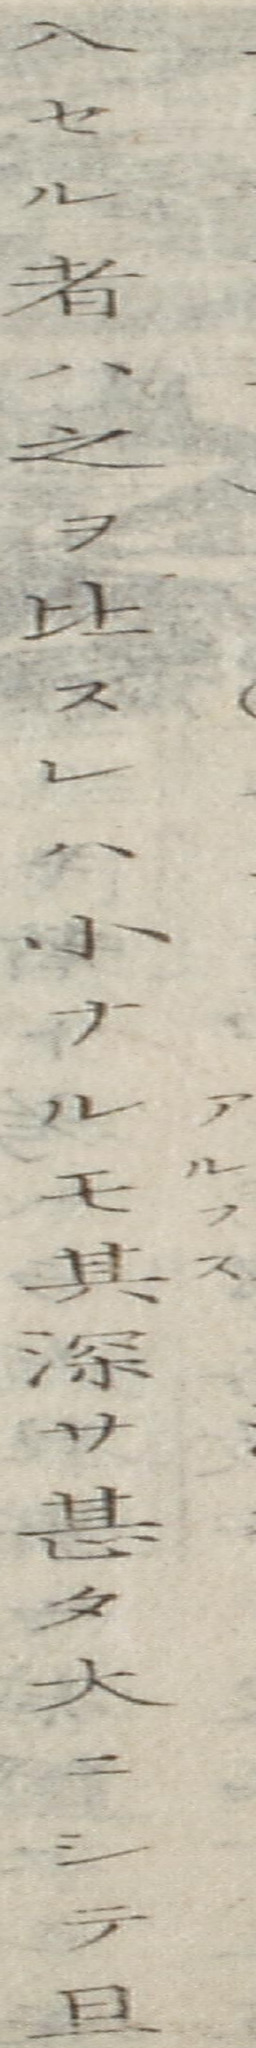入セル者ハ之ヲ比スレハ小ナルモ其深サ甚タ大ニシテ旦
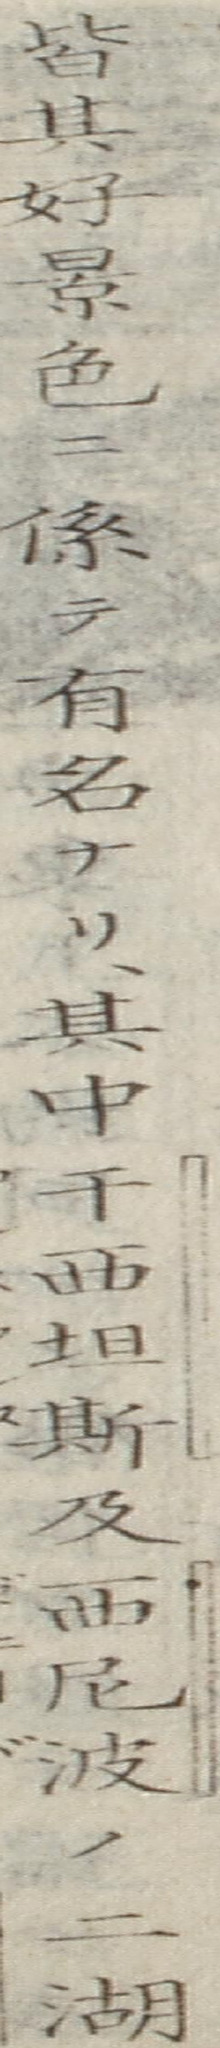皆其好景色ニ係テ有名ナリ、其中干西担斯及西尼波ノ二湖
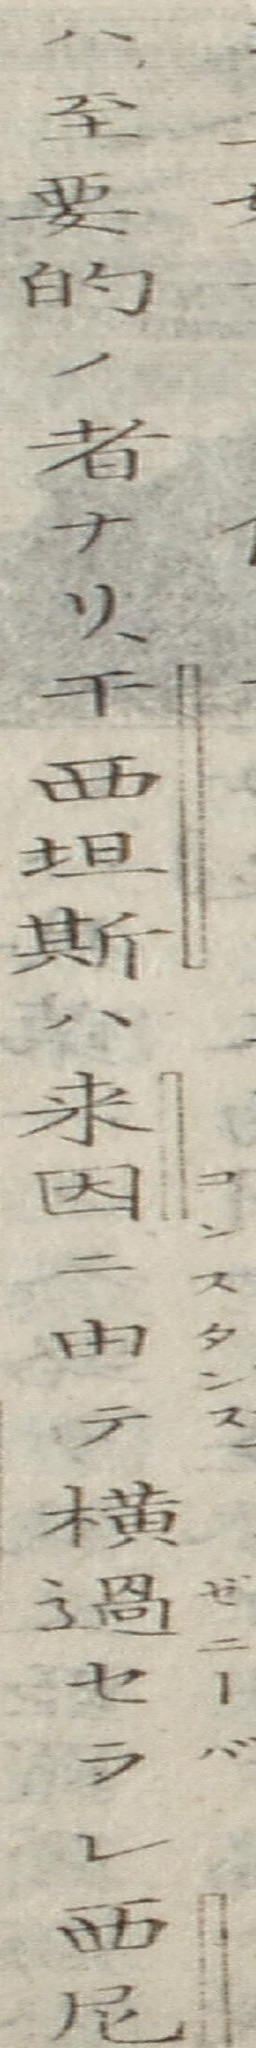ハ至要約ノ者ナリ、干西担斯ハ来因ニ由テ横過セラレ西尼
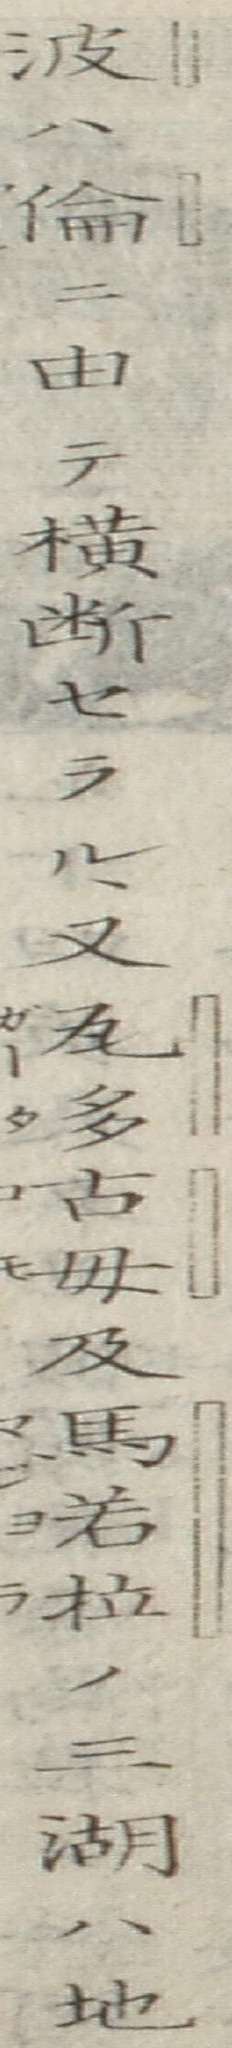波ハ倫ニ由テ横断セラル、又瓦多古母及馬若拉ノ三湖ハ地
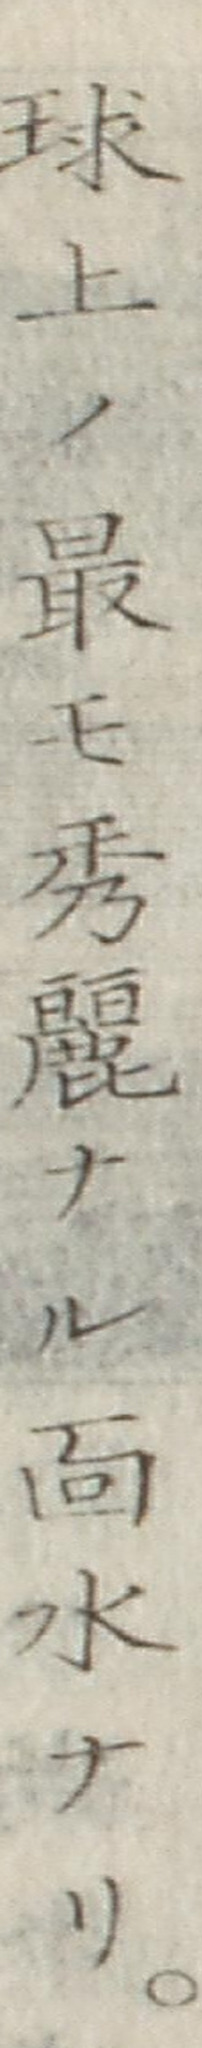球上ノ最秀麗ナル面水ナリ。
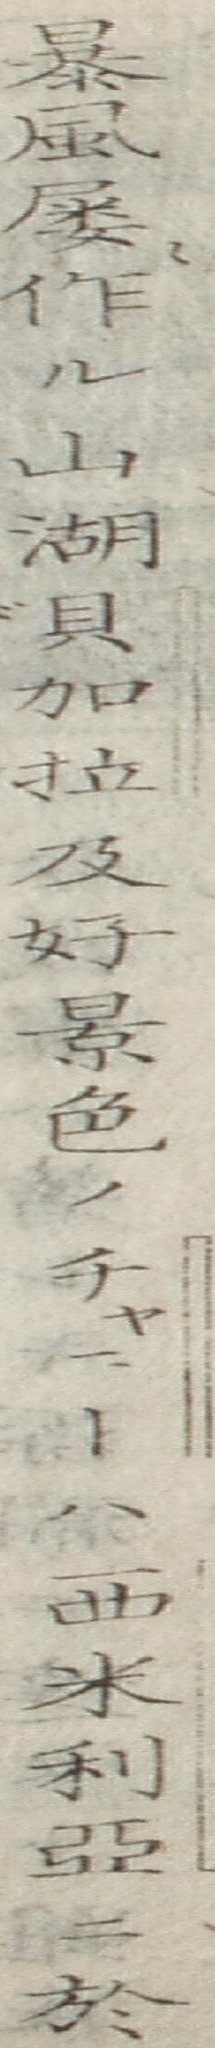暴風屡〻作ル山湖貝加拉及好景色ノチャニーハ西米利亜ニ於
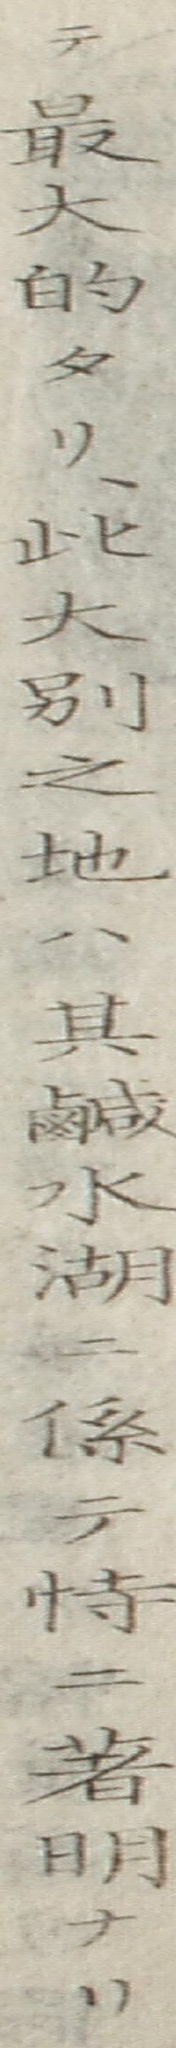テ最大的タリ、此大別之地ハ其鹹水湖ニ係テ特ニ著明ナリ
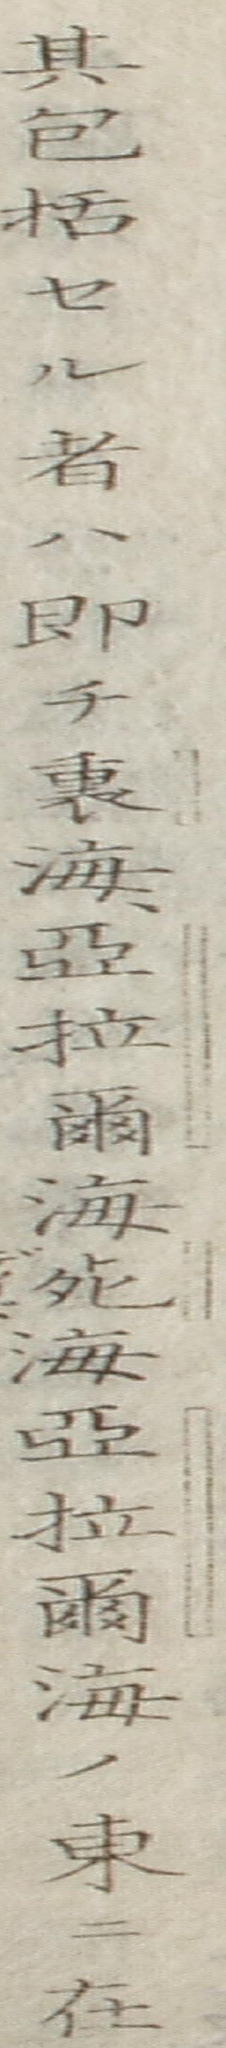其包括セル者ハ即チ裏海、亜拉爾海死海亜拉爾海ノ東ニ在
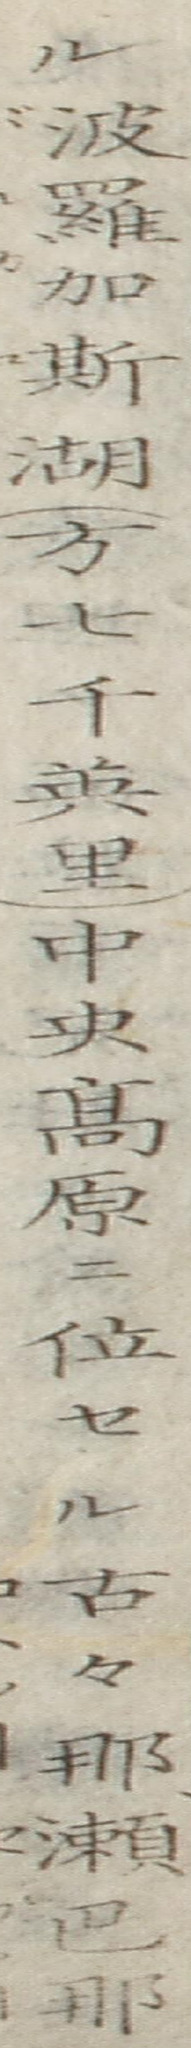ル波羅加斯湖中央高原ニ位セル古々那、瀬巴那

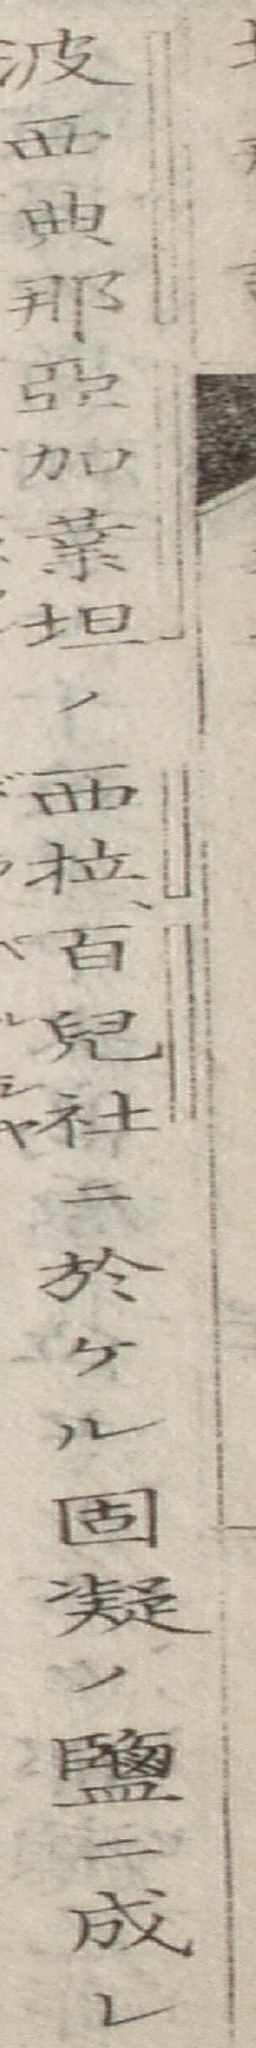波西典那亜加葉担ノ西拉、百児社ニ於ケル固凝ノ塩ニ成レ
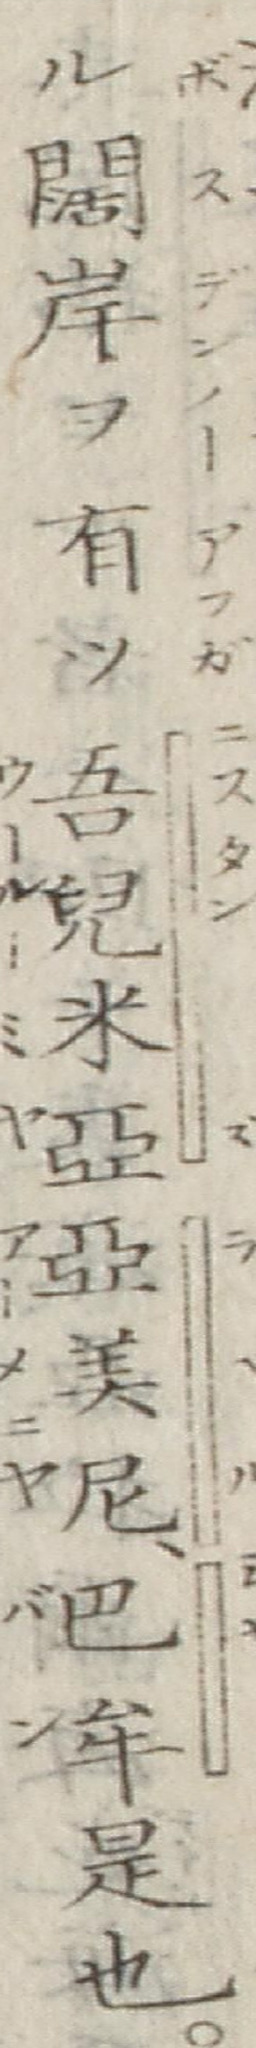ル闊岸ヲ有ツ吾児米亜亜美尼巴牟是也。
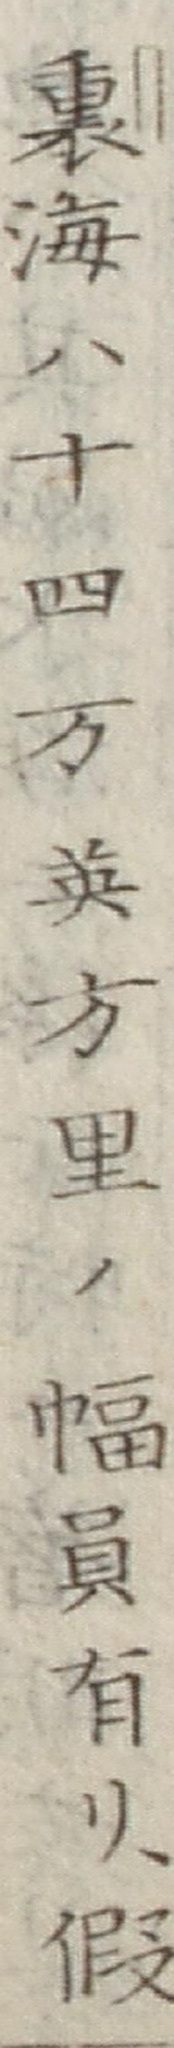裏海ハ十四万英方里ノ幅員有リ、仮
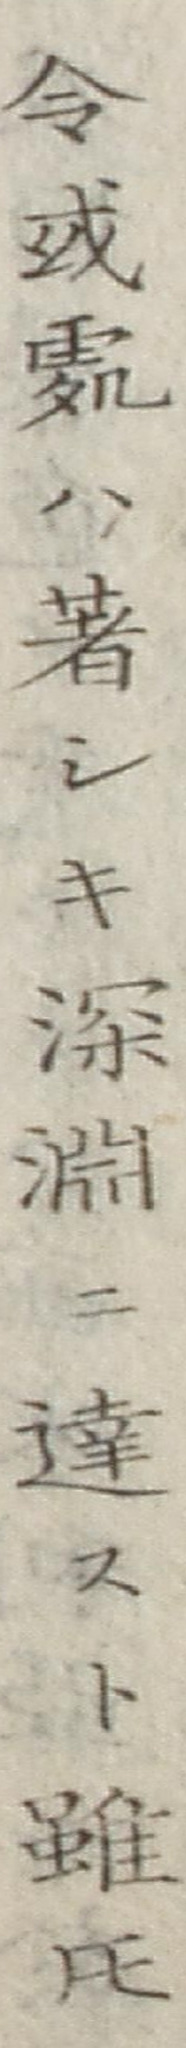令或処ハ著シキ深淵ニ達スト雖トモ
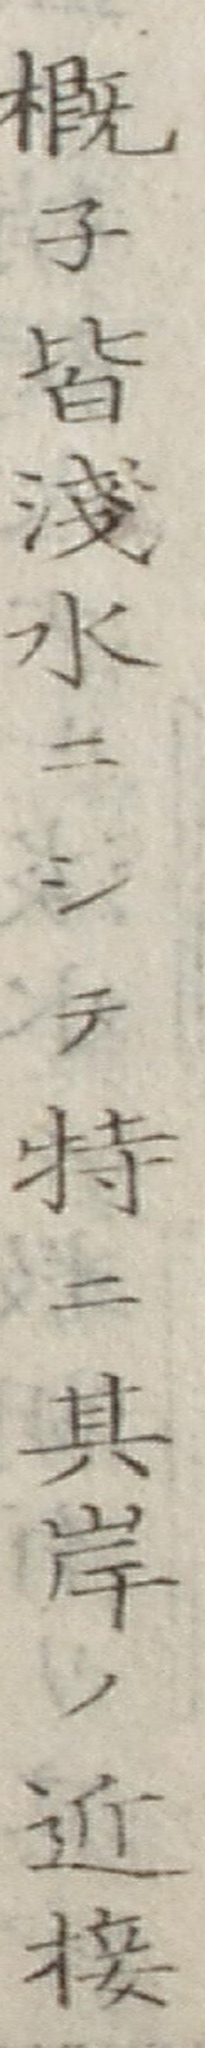が概ね皆浅水ニシテ特ニ其岸ノ近接
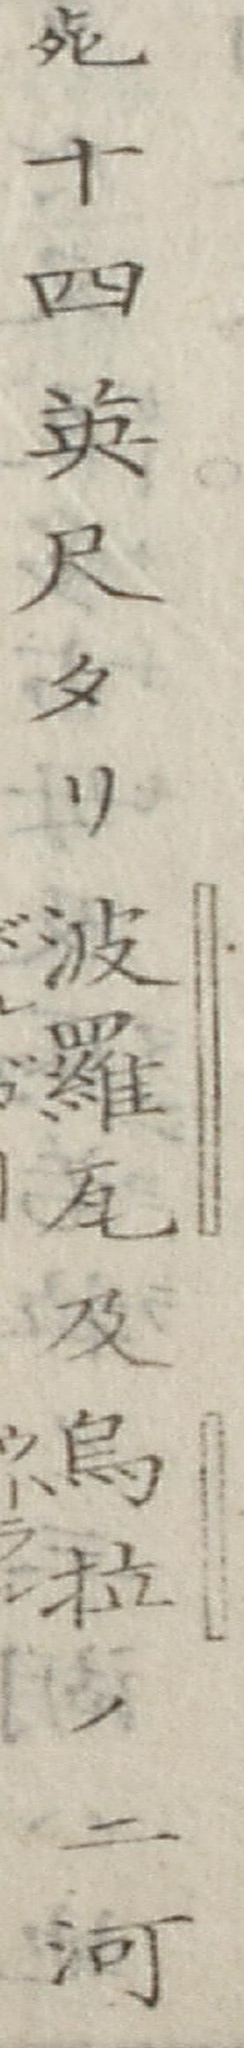十四英尺タリ波羅瓦及烏拉ノ二河
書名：地形論　巻二
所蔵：東京大学地震研究所図書室 Earthquake Research Institute Library, The University of Tokyo, JAPAN
